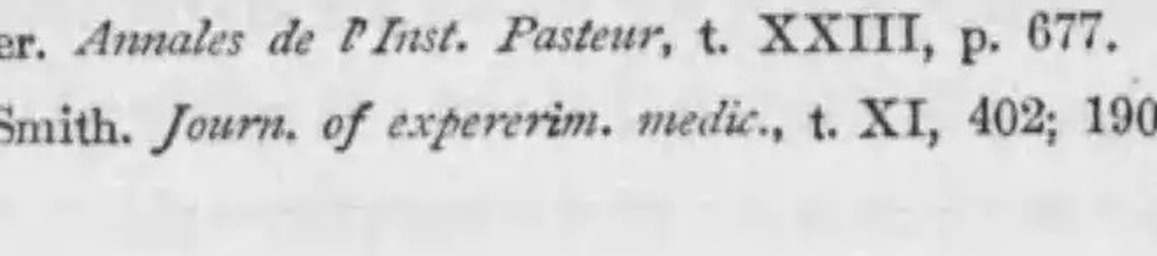,,,,,,,,;,

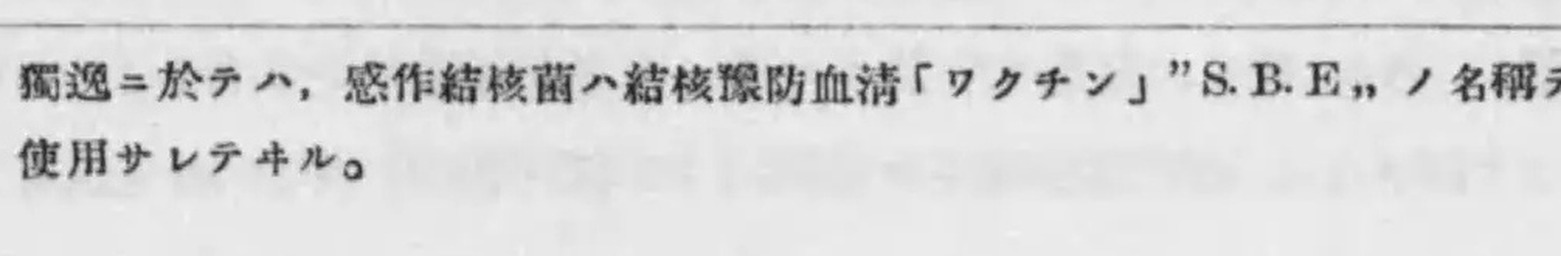()独逸に於ては、感作結核菌は結核予防血清「ワクチン」”,,,,の名称で

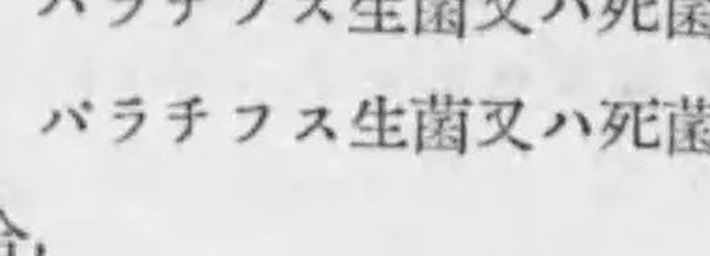)パラチフス生菌、感作。
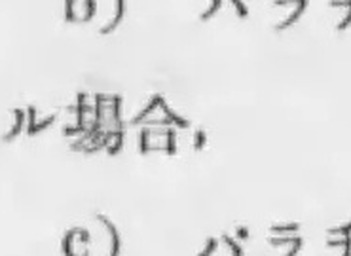る場合

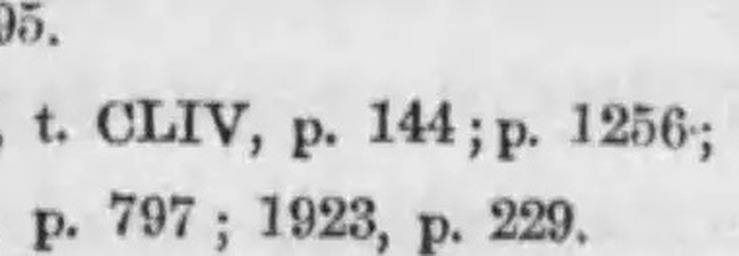,,,’,,,;,,,

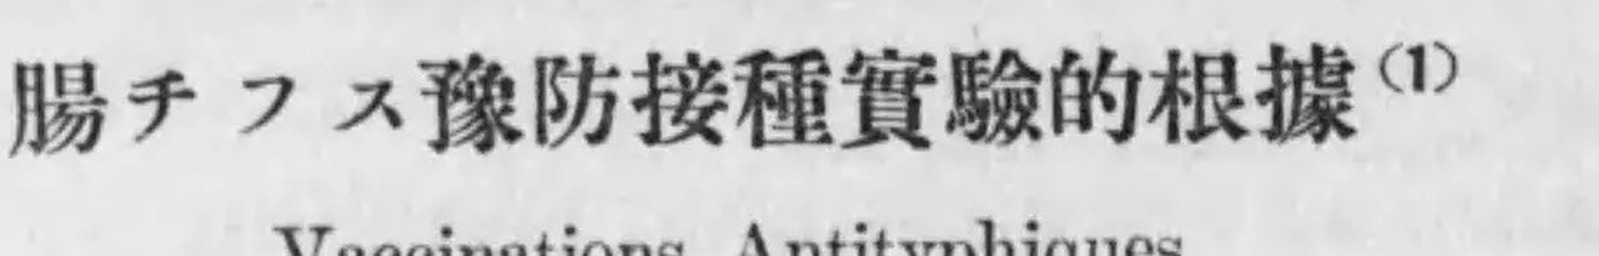腸チフス予防接種実験的根拠()

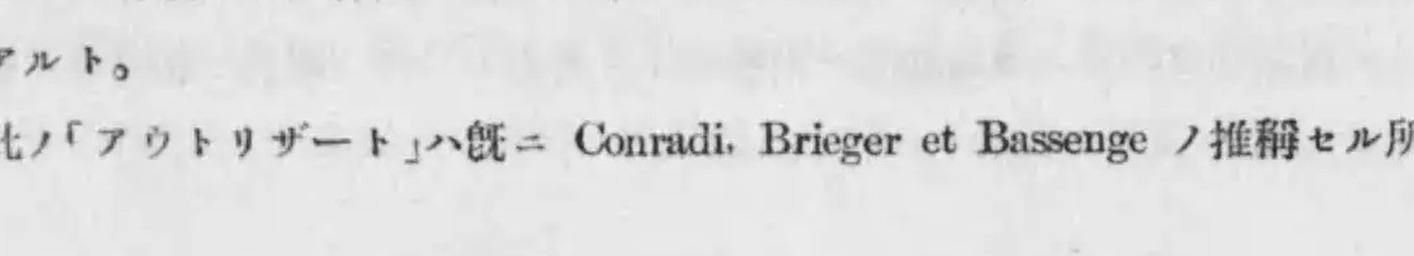此の「アウトリザート」は既に,の推称せる所
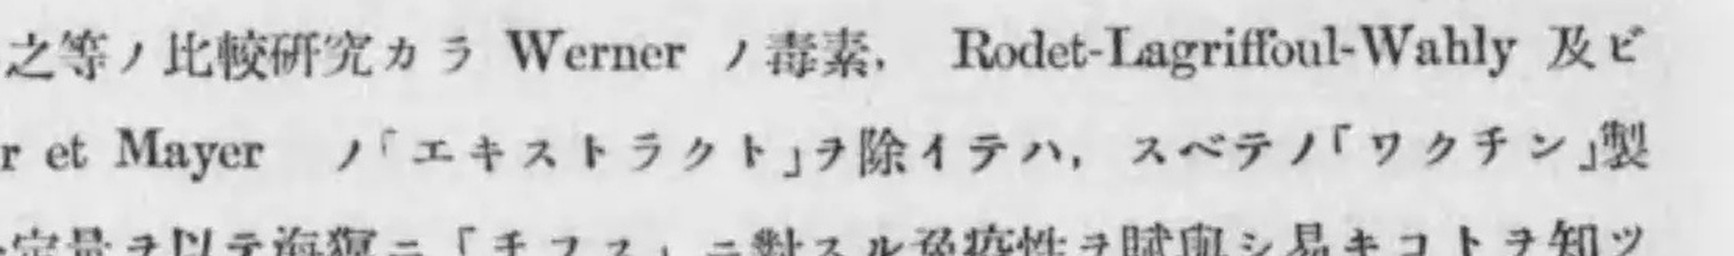の「エキストラクト」を除いては、すべての「ワクチン」製

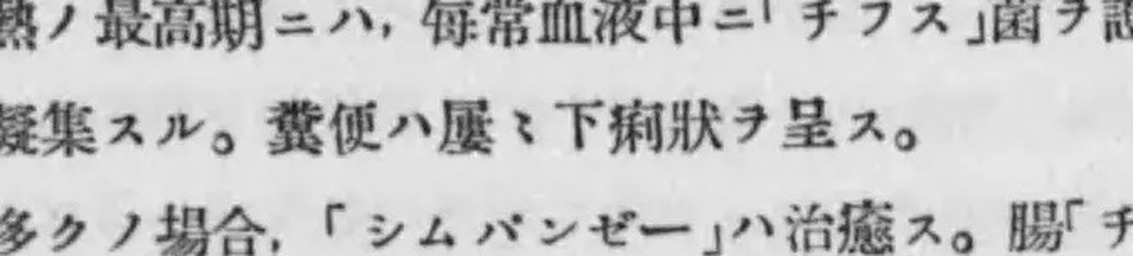で凝集する。糞便は屡々下痢状を呈す。
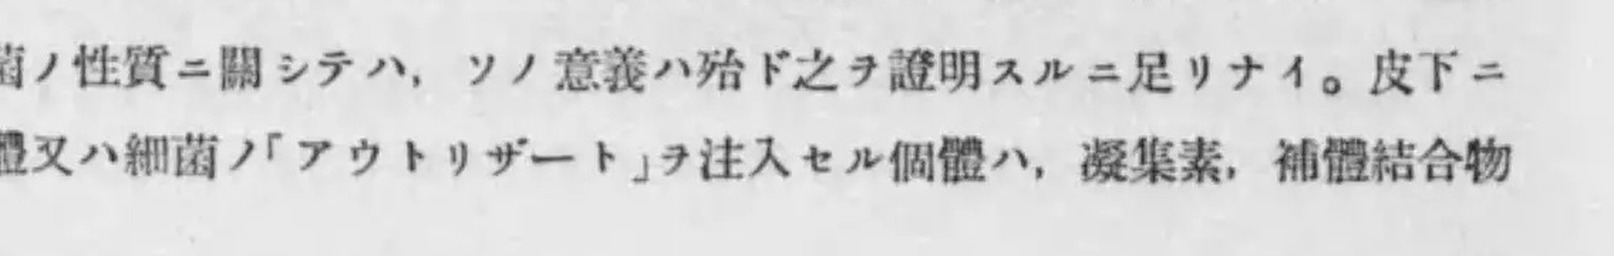細菌体又は細菌の「アウトリザート」を注入せる個体は、凝集素、補体結合物

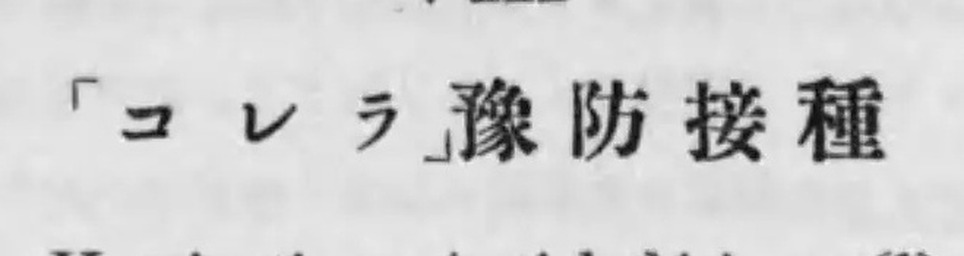「コレラ」予防接種
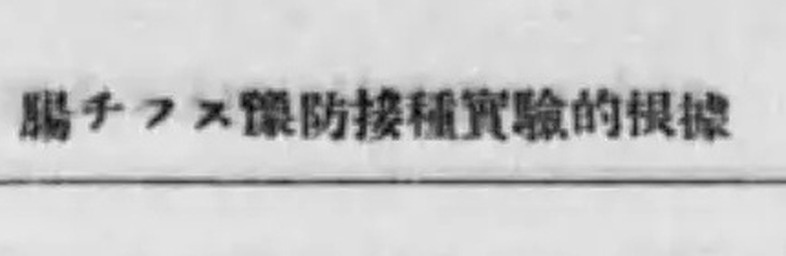腸チフス予防接種実験的根拠

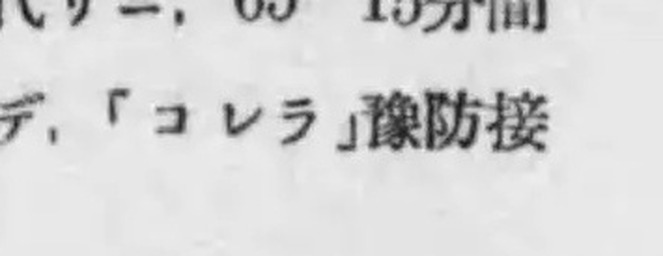「コレラ」予防接種
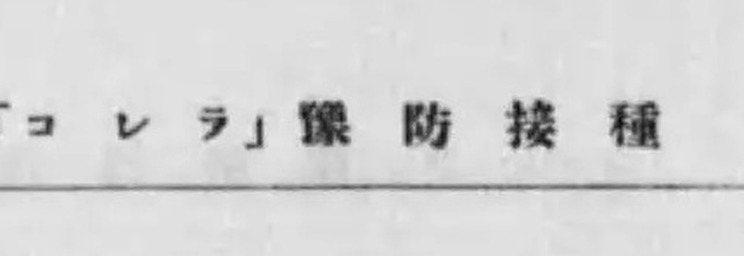「コレラ」予防接種

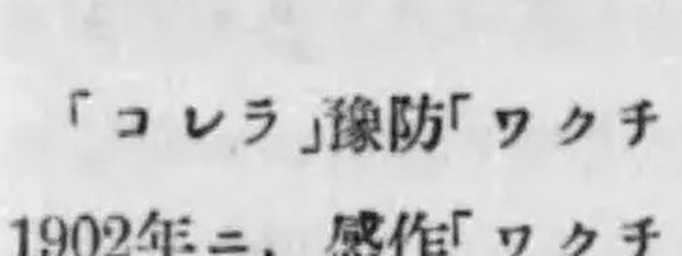「コレラ」予防接種

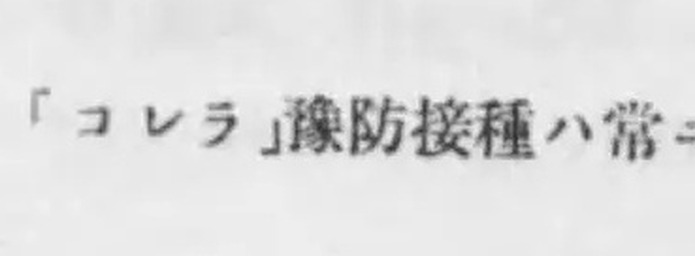「コレラ」予防接種
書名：伝染病ニ於ケル免疫ニ関スル研究
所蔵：国立国会図書館 National Diet Library, JAPAN
